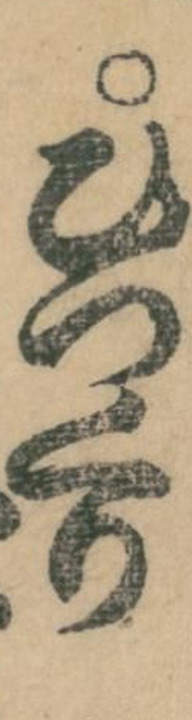◯ひつくり
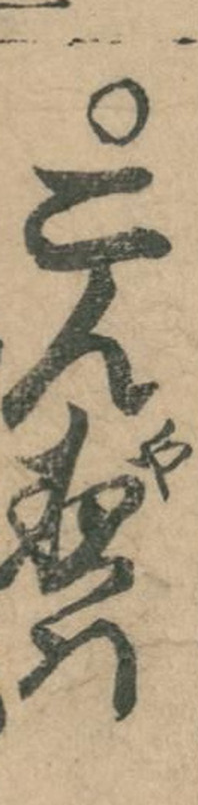◯こん夜は
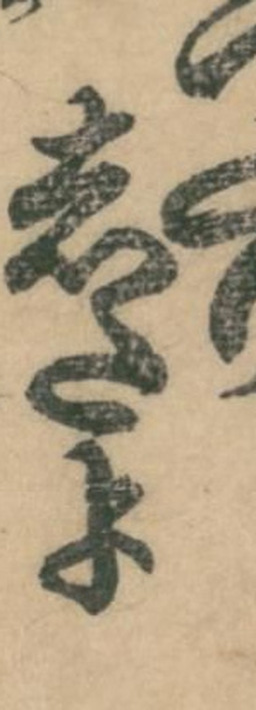したよ
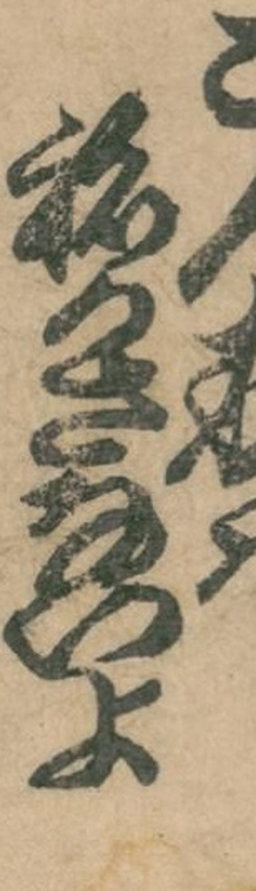ねかさないよ
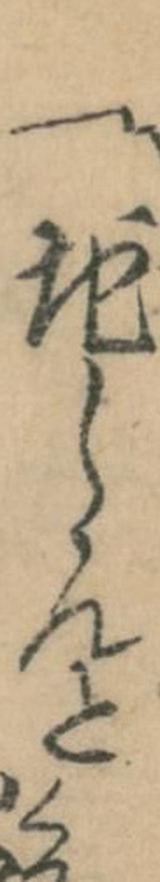〽地しんと
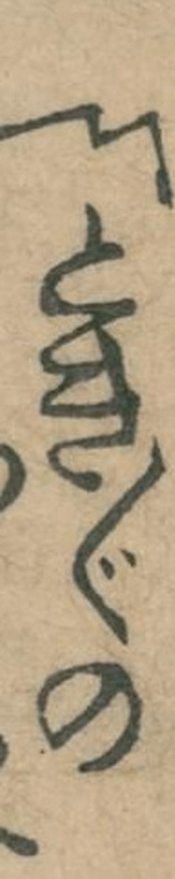〽とき〴〵の
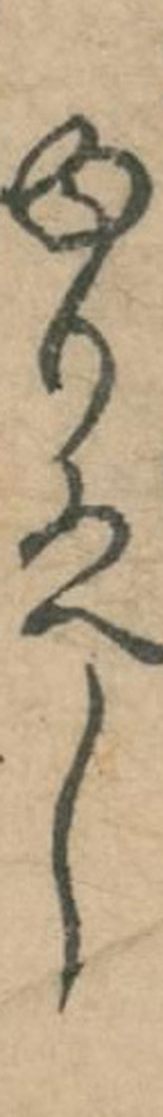ゆりかへし
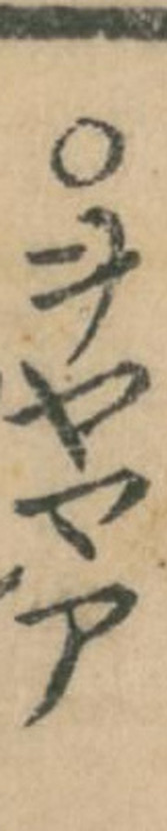◯ヲヤマア
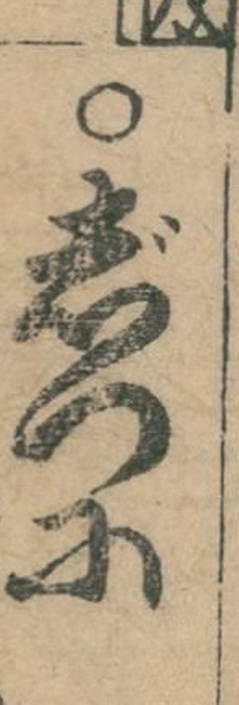◯じつに
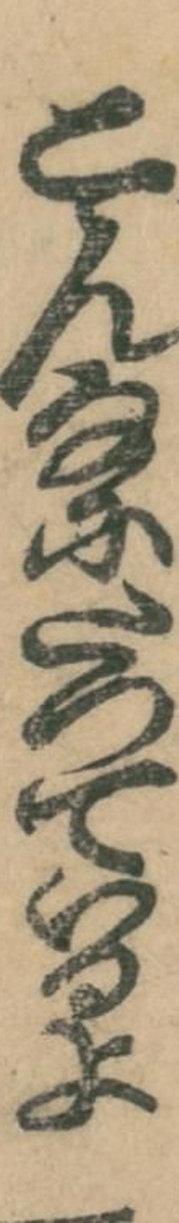こんなにたつているよ
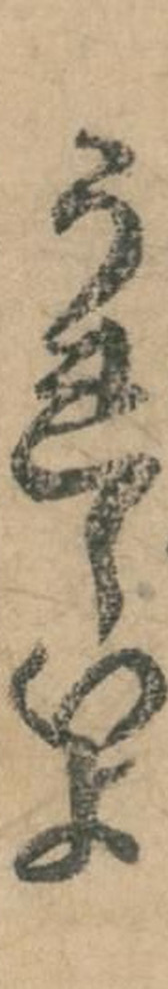うれしいよ
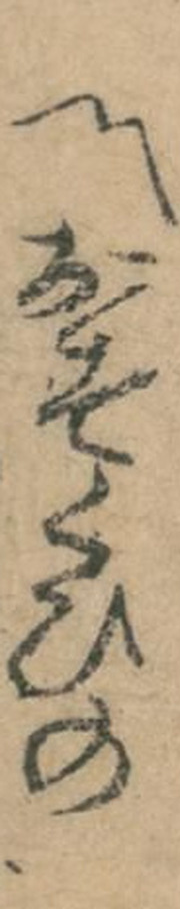〽おすくひの
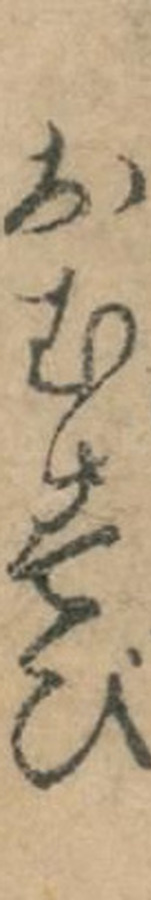おむすび
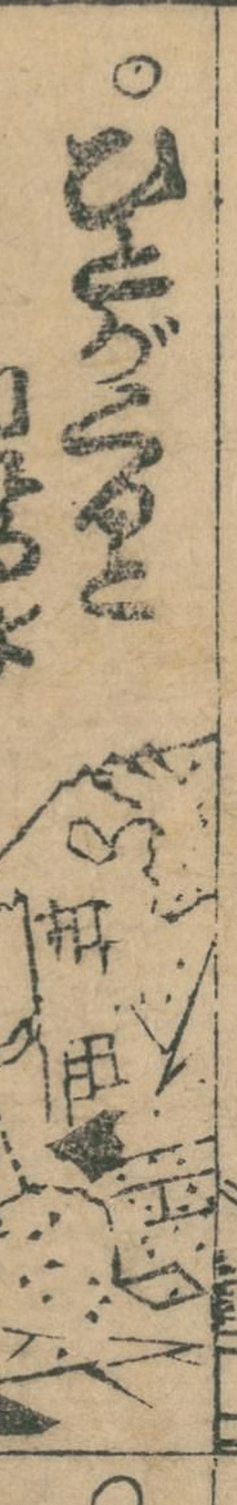◯ひとがくると
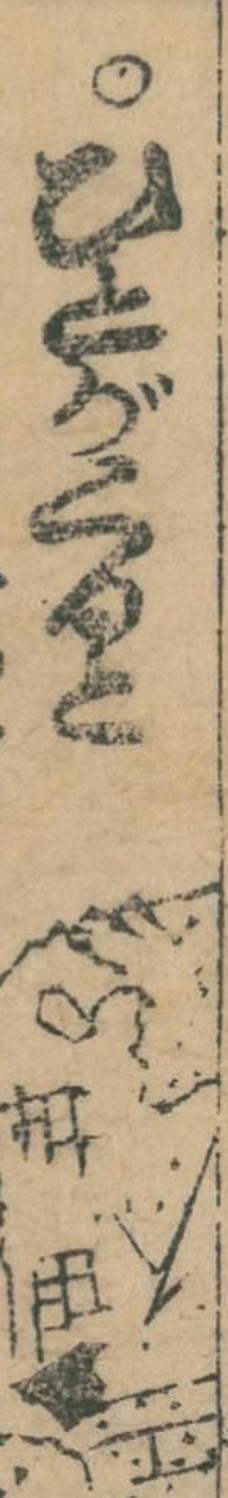◯ひとがくると
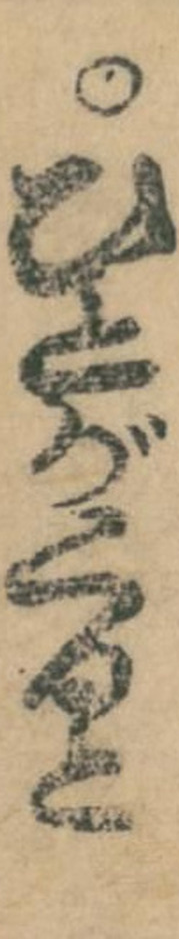◯ひとがくると
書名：地震出火　例のおわらひ
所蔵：東京大学地震研究所図書室 Earthquake Research Institute Library, The University of Tokyo, JAPAN
